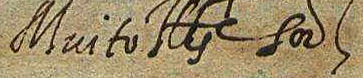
Muito Ill̄se sor̄
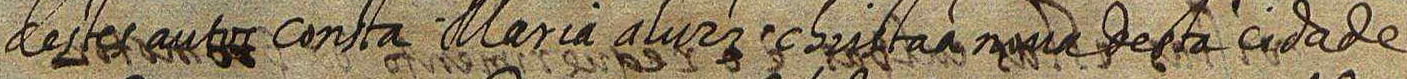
destes autos consta Maria alurz̄ christaā noua desta cidade
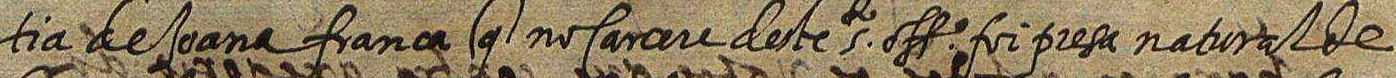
tia de Joana franca q̄ no Carcere deste sto. off.o foi presa natural de
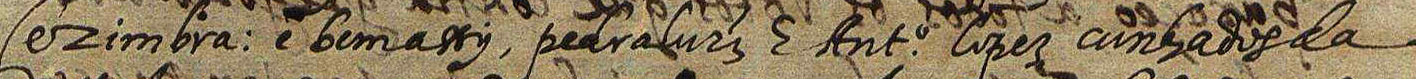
Cezimbra: e bem assy, pedralurz̄ E Ant.o lopez cunhados da
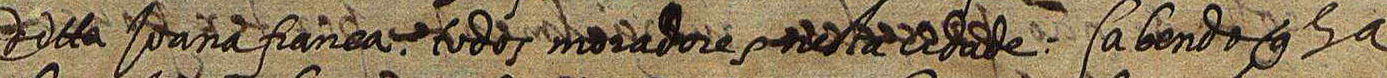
ditta Joanna franca. todos moradores nesta cidade. sabendo q̄ ha
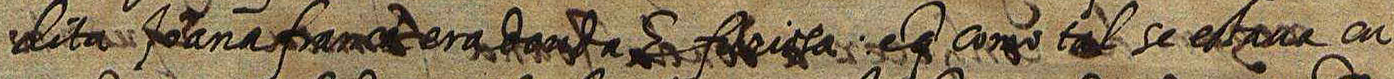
dita Joana franca era douda E furiosa: e q̄ como tal se estaua cu
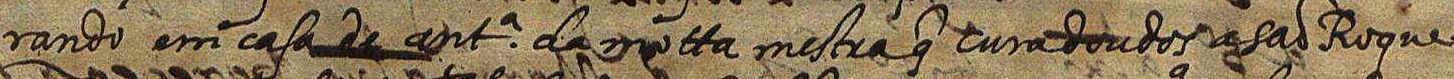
rando em casa de anta. da motta mestra q̄ cura doudos a saõ Roque
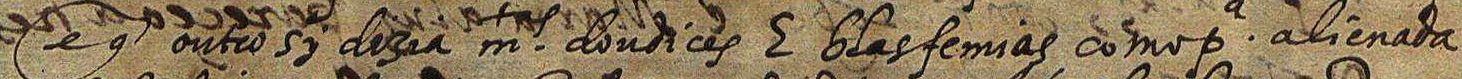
e q̄ outrosy dizia mtas. doudices E blasfemias, como pa. alienada
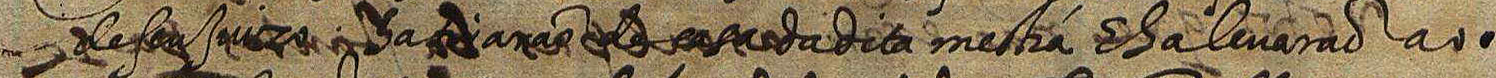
de seu Juizo ha tiraraõ de casa da dita mestra E ha leuaraõ ao
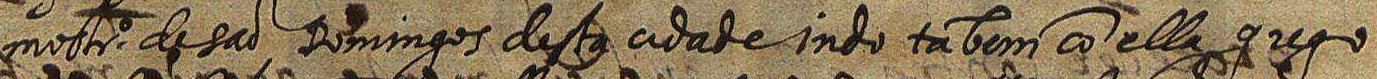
mostr.o de saõ Domingos desta cidade indo tābem cō ella grego
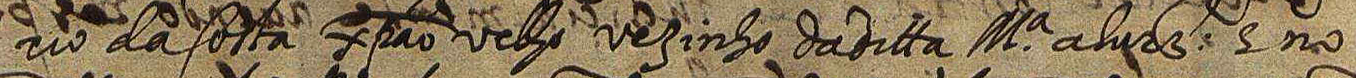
rio da Costa xpão velho vezinho da ditta M.a alurz̄: E no
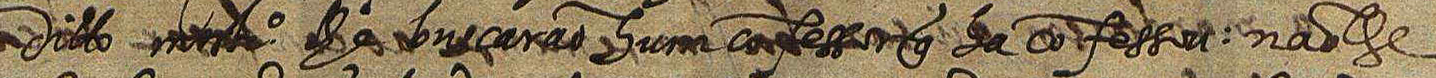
ditto mostro. lhe buscaraõ hum cōfessor q̄ ha cōfessou: naõ lhe
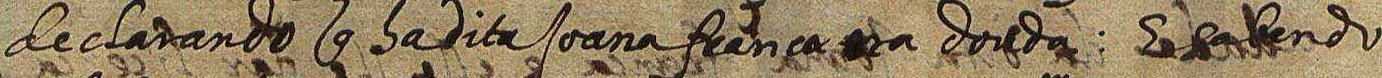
declarando q̄ ha dita Joana franca era douda: E sabendo
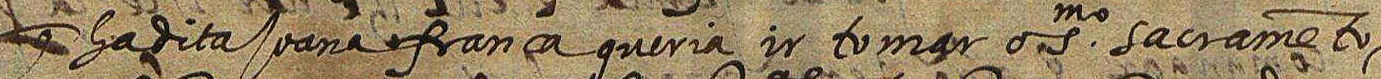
q̄ ha dita Joana franca queria ir tomar o smo. sacramēto
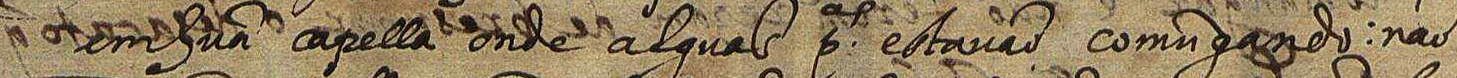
em huā capella onde alguas̄ pas. estauaõ comūgando: naõ
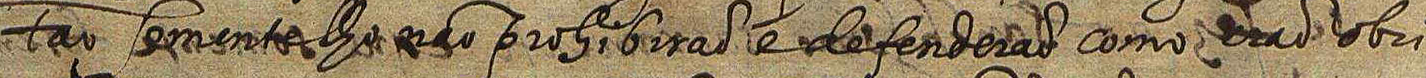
tão somente lho naõ prohibiraõ e defenderaõ como eraõ obri
